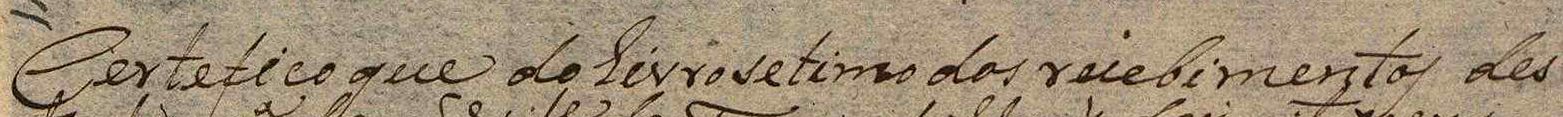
Certefico que do Livro setimo dos recebimentos des
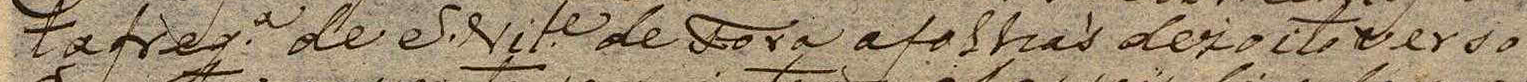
ta freg. de S. Vit.e de Fora a folhas dezoito verso
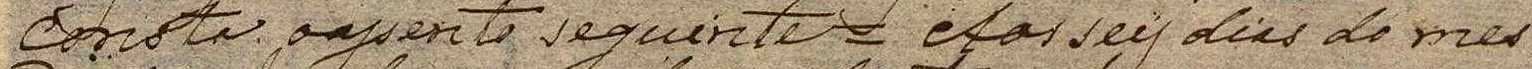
consta o assento seguinte= Aos seis dias do mes
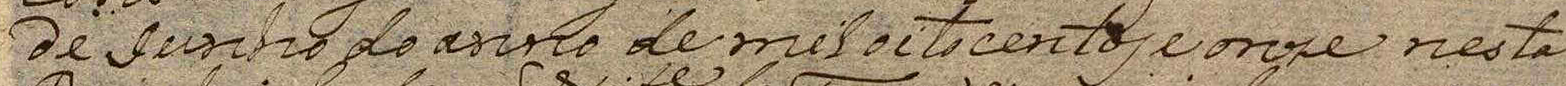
de Junho do anno de mil oitocentos e onze nesta
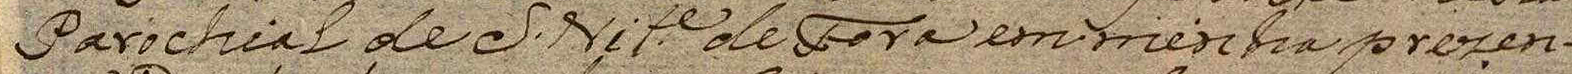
Parochial de S. Vit.e de Fora em minha prezen
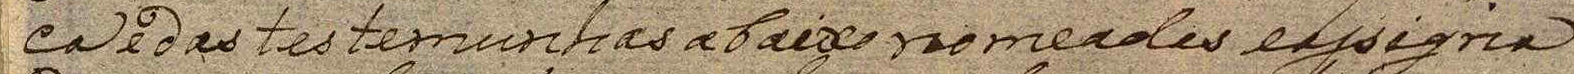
ça e das testemunhas abaixo nomeades e assigna
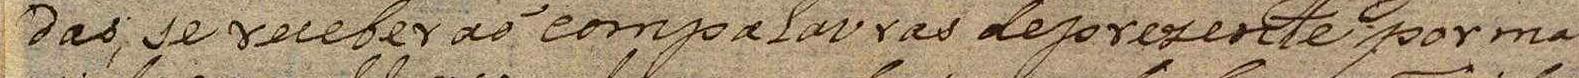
das, se receberaõ com palavras de prezente por ma
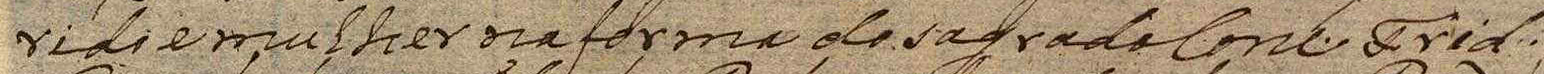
rido e mulher na forma do sagrado Conc. Trid.
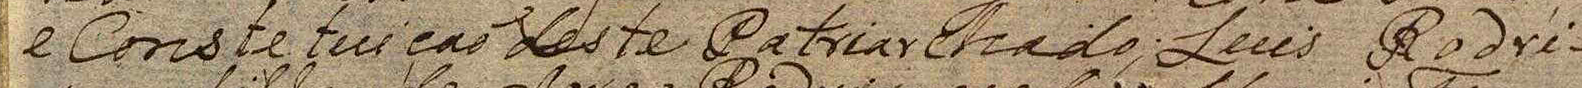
e Constetuiçaõ deste Patriarchado; Luis Rodri
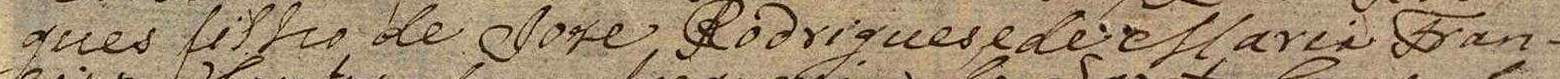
ques filho de Joze Rodrigues, e de Maria Fran
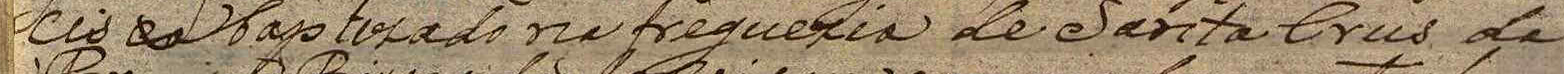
cisca baptizado na freguezia de Santa Crus de
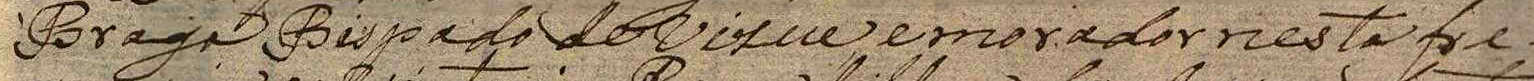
Braga Bispado de Vizeu, e morador nesta fre
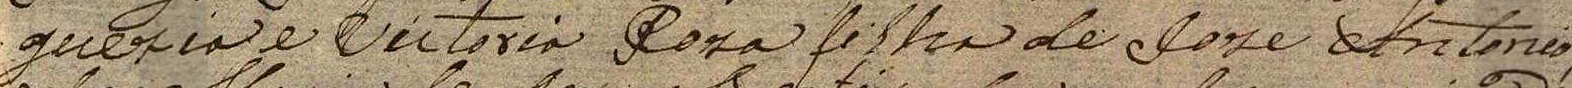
guezia, e Victoria Roza filha de Joze Antonio,
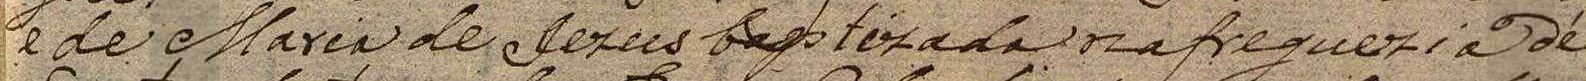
e de Maria de Jezus baptizada na freguezia de
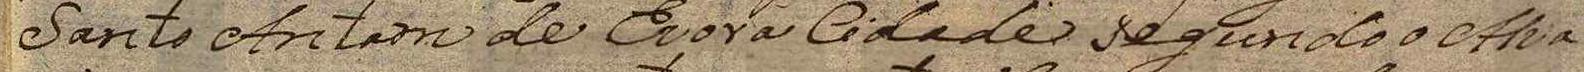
Santo Antam de Evora Cidade segundo o Alva
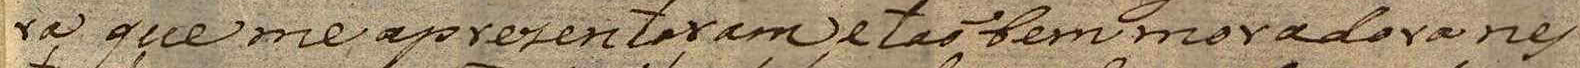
ra que me aprezentaram, e taõbem moradora nes
